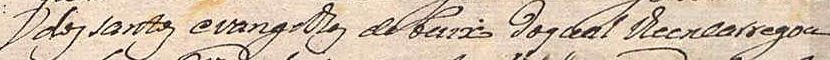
dos santos evangelhos debaixo do qual lhe encarregou
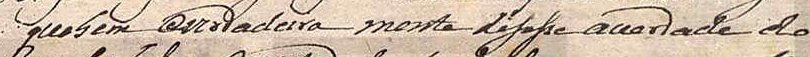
que bem e verdadeiramente disesse a uerdade do
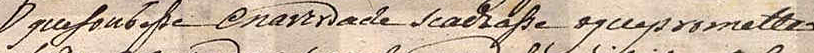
que soubesse e na verdade se achasse o que prometteo
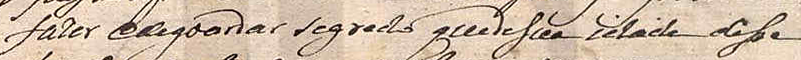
fazer e de goardar segredo que de sua idade disse
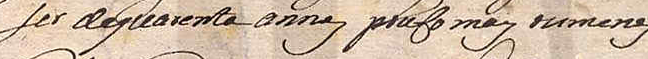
ser de quarenta annos pouCo mais ou menos
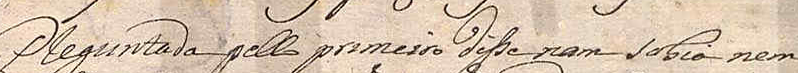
Preguntada pello primeiro disse nam sabia nem
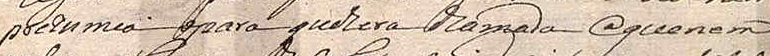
prezumia o para que hera chamada e que nem
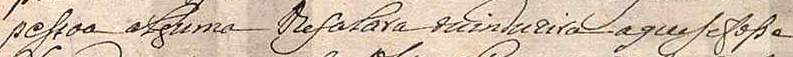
pessoa alguma lhe falara ou induzira a que se fosse
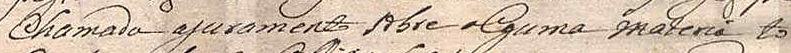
chamada a juramento sobre alguma materia to
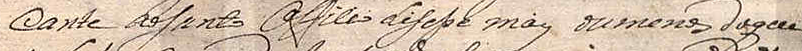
cante ao santo Officio disesse mais ou menos do que
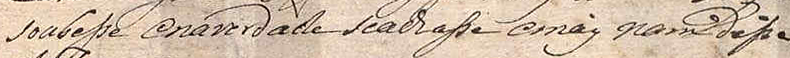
soubesse e na verdade se achasse e mais nam disse
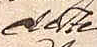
deste
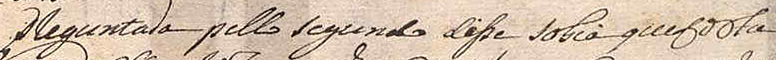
Preguntada pello segundo disse sabia que Costu
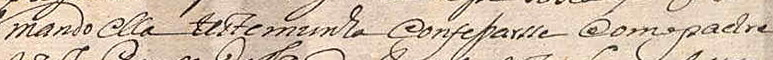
mando ella testemunha confessarsse com o padre
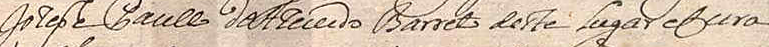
Jozeph Paullo de AZeuedo Barreto deste lugar e Cura
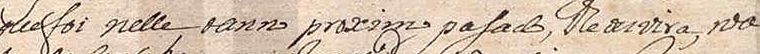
que foi nelle, o anno proximo pasado, lhe ouvira, no a
